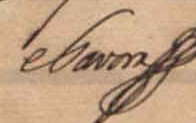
e Tavora
